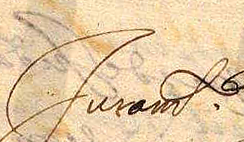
Juramt.o
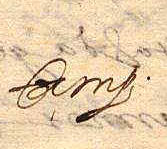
temp.
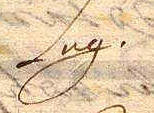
Lug.
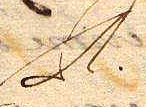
R.
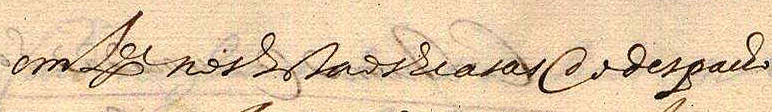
em Lxa nos Estaos E casas do despacho
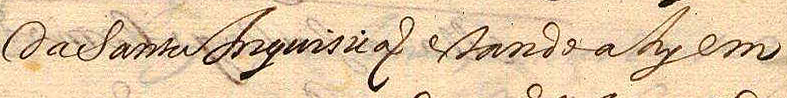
da Santa Inquisiçaõ estando ahy em
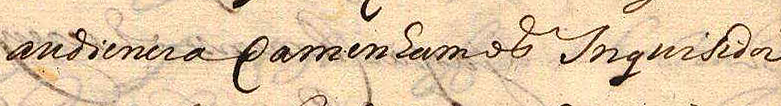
audiencia da menham o sor Inquisidor
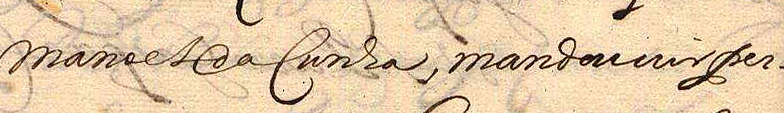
manoel da Cunha, mandou uir per
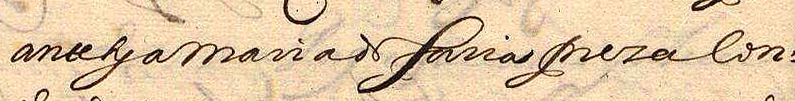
ante sy a maria de faria preza con
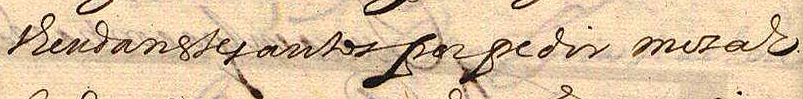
theuda nestes autos por pedir meza E
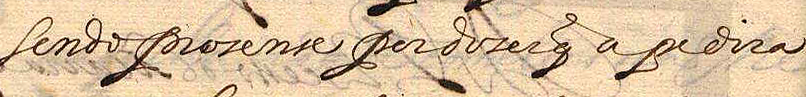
sendo prezente por dizer q̄ a pedira
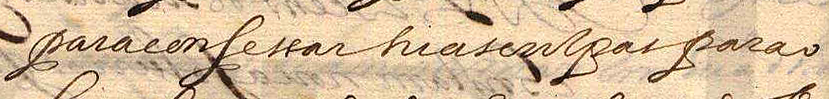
para confessar suas culpas para o
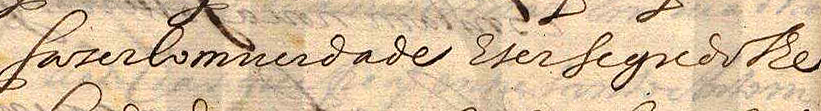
fazer com uerdade E ter segredo lhe
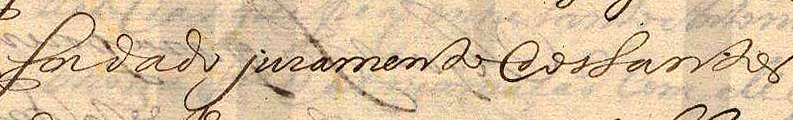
foi dado juramento dos santos
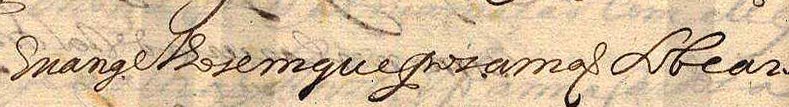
Euangelhos em que pos a maõ sob car
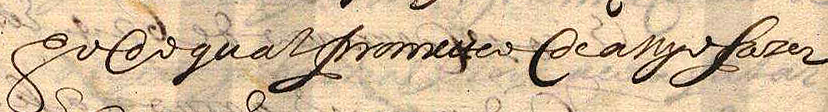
go do qual prometteo de assy o fazer
